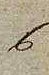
6
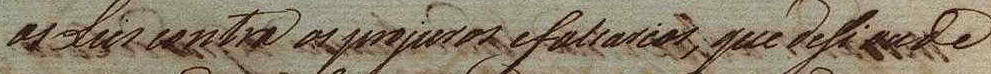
as Leis contra os prejuros e falsarios, que de si ou de
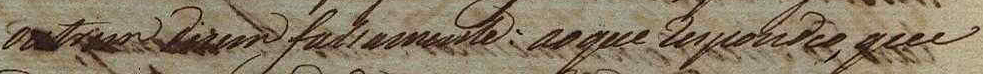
outrem dizem falsamente ao que Respondeo, que
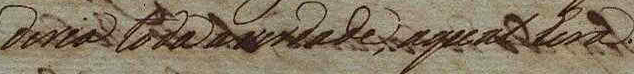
diria toda a verdade, a qual hera.
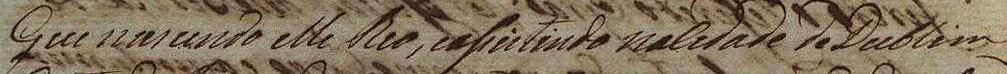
Que nascendo elle Reo, e assistindo na Cidade de Dublim
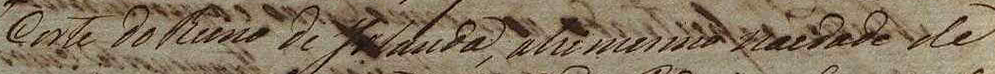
Corte do Reino de Jrlanda, ahi mesmo na idade de
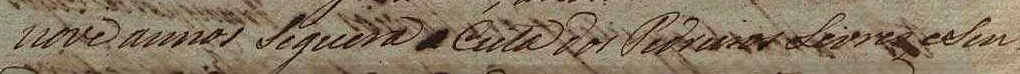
nove annos seguira a ceita dos Pedreiros Livres, e Sen
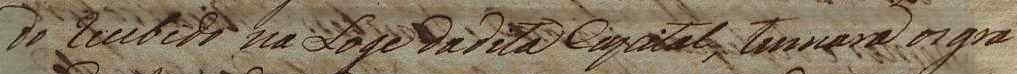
do Recebido na Loge da dita Capital, tomara os gra
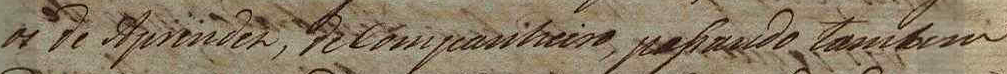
os de Aprendiz, de Companheiro, passando tambem
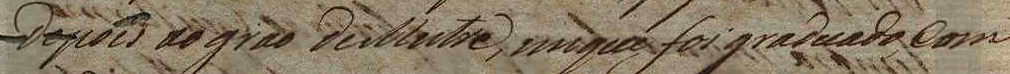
depois ao grao de Mestre, em que foi graduado, Com
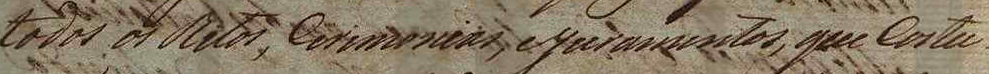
todos os Ritos, Ceremonias, e juramentos, que Costu
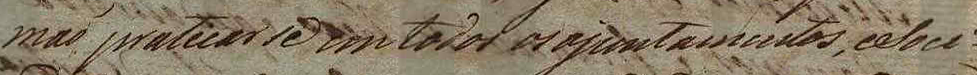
maõ praticarse em todos os ajuntamentos, e Soci
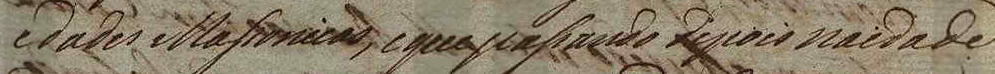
edades Massonicas, e que passando depois da idade
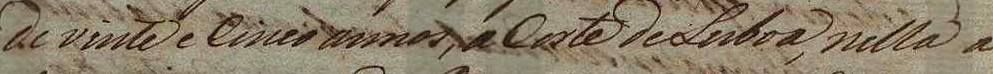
de vinte e Cinco annos, a Corte de Lisboa, nella a
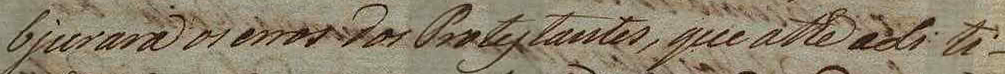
bjurara os erros dos Protestantes, que athe ahi ti
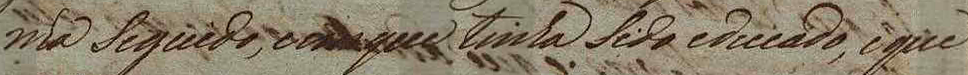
nha Seguido, e em que tinha Sido educado, e que
